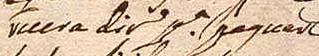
recera diro pa. paguar
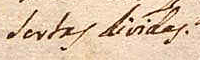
sertas dividas.
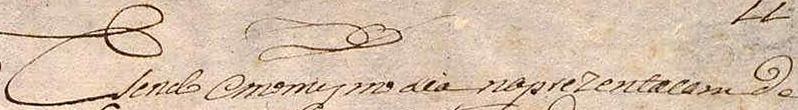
E sendo em o mesmo dia na prezentacam de
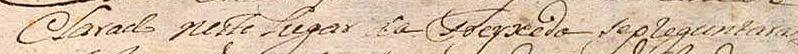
Clarado neste lugar da Freyxeda se preguntaram
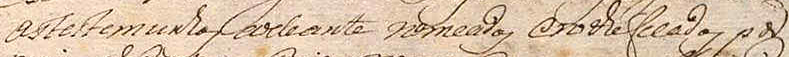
as testemunhas aodeante nomeadas, e notheficadas por
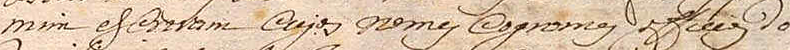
mim escrivam cujos nomes cognomes officios do
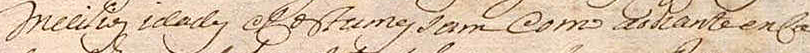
mecilios idades e Costumes sam como aodiante en Ca
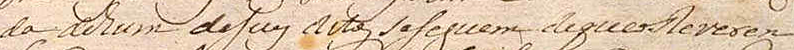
da de hum de seus ditos se seguem de que o Reveren
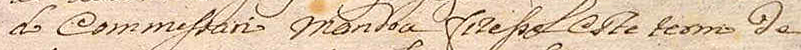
do Commissario mandou fizesse este temo de
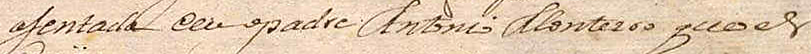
asentada e eu o padre Antonio Monteiro que es
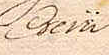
Creui
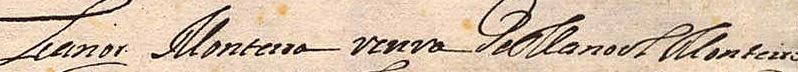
Leanor Monteira veuva de Manoel Monteiro
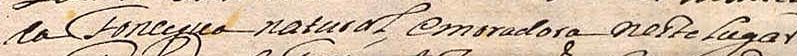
da Foncequa natural, e moradora neste lugar
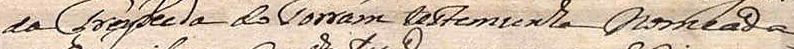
da Freyxeda do Torram testemunha nomeada
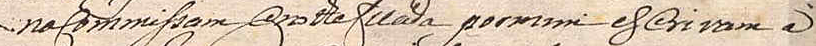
na Commissam e notheficada por mim escrivam a
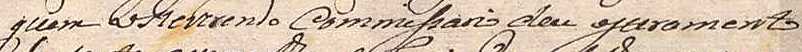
quem o Reverendo commissario deu o juramento
